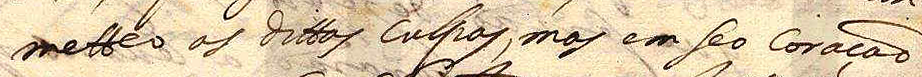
metteo as dittas culpas, mas em seo coração
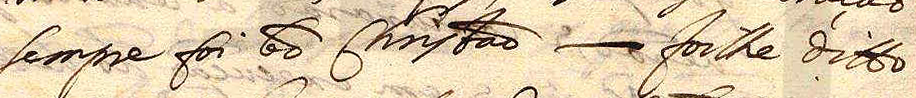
sempre foi bō Christão - foilhe ditto
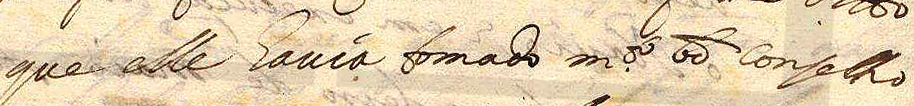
que elle hauia tomado m.to bō conselho
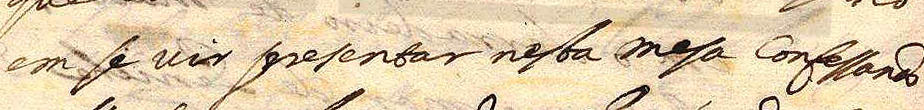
em se uir presentar nesta mesa confessando
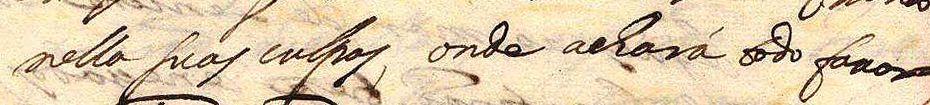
nella suas culpas, onde achará todo fauor
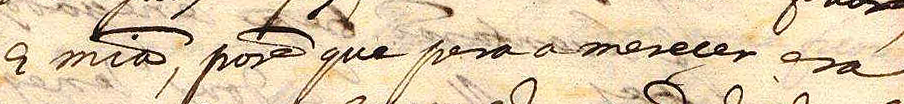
E mīa, porē que pera a merecer era
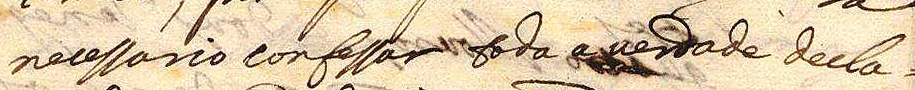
necessario confessar toda a uerdade decla
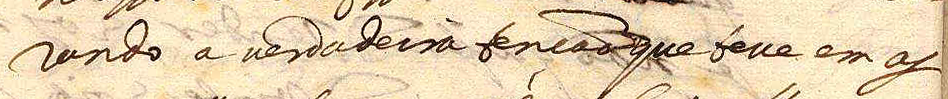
rando a uerdadeira tençaõ que teue em as
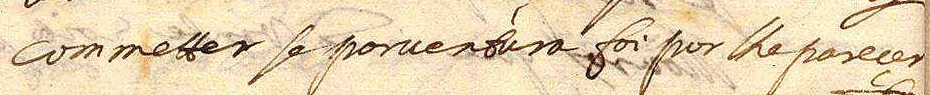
commetter se poruentura foi por lhe parecer
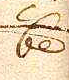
bē
